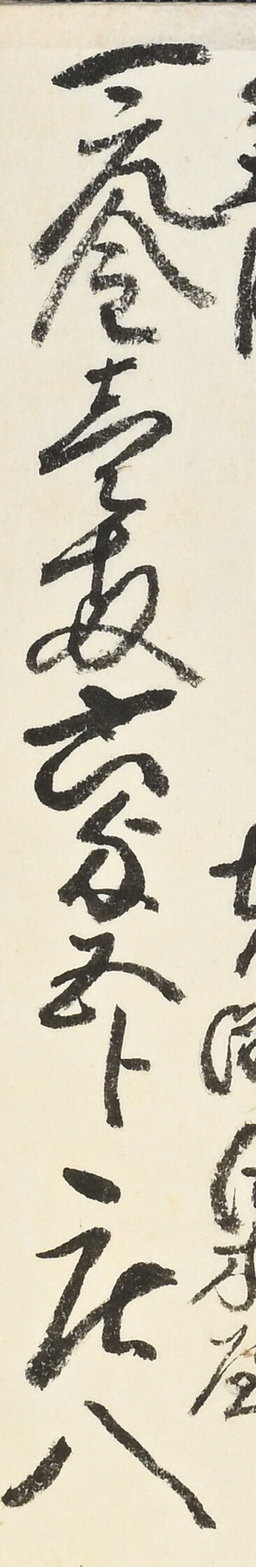一元金壱両六匁五分庄八
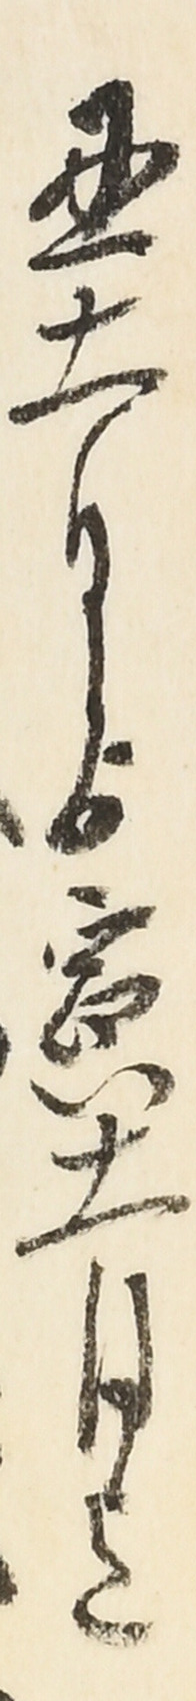丑十一月ゟ寅十一月迄
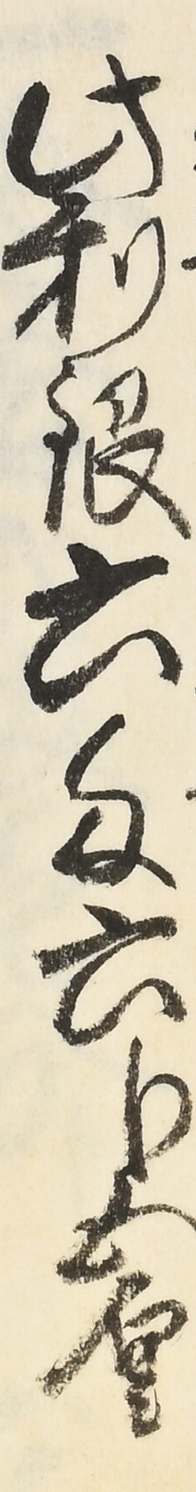此利銀弐匁六分壱厘
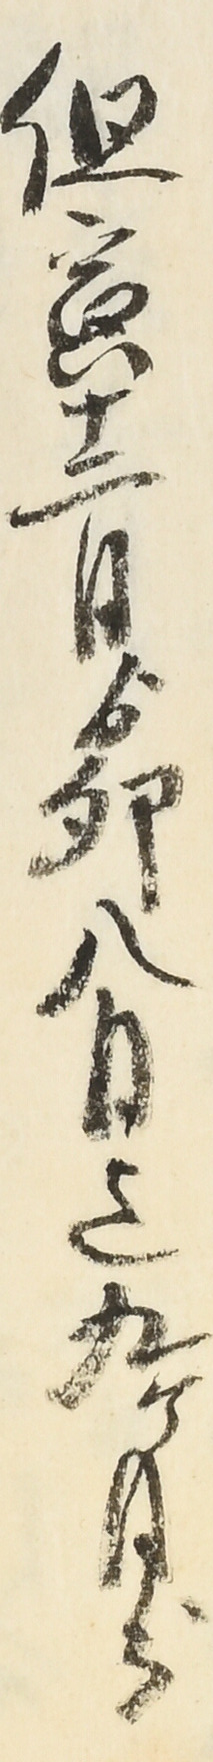但寅十二月ゟ卯八月迄九ヶ月分

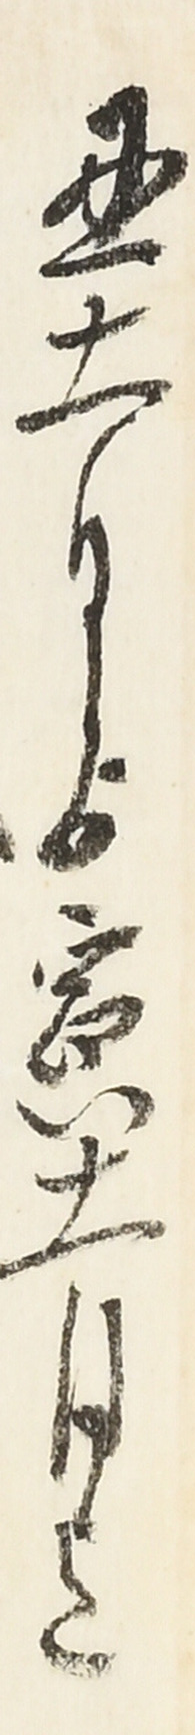丑十一月ゟ寅十一月迄
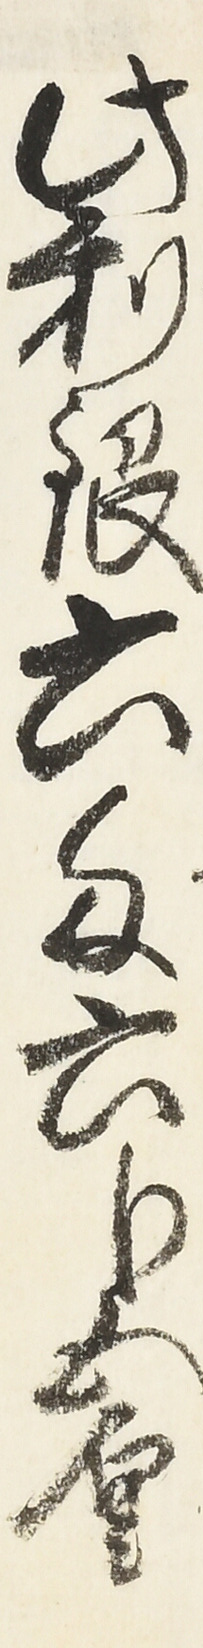此利銀六匁六分五厘
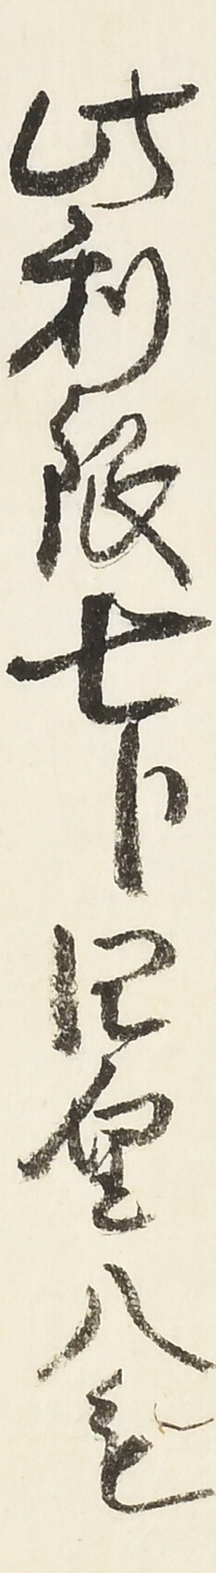此利銀七分四厘八毛
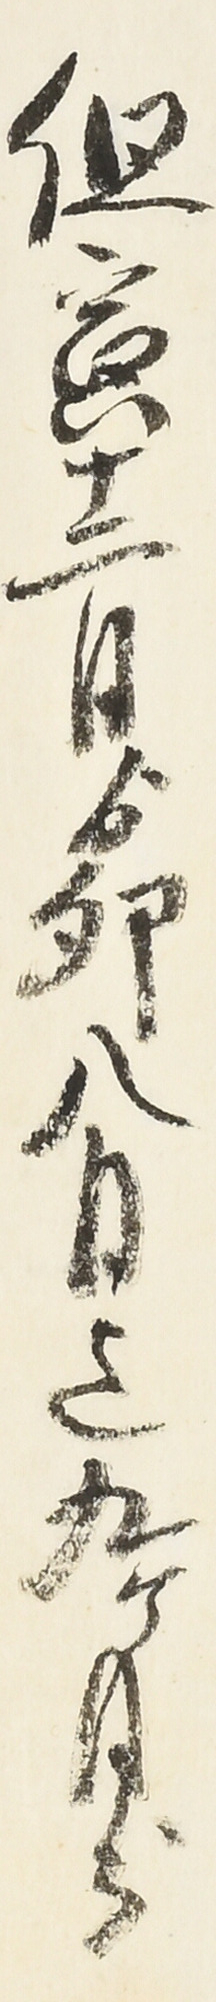但寅十二月ゟ卯八月迄九ヶ月分
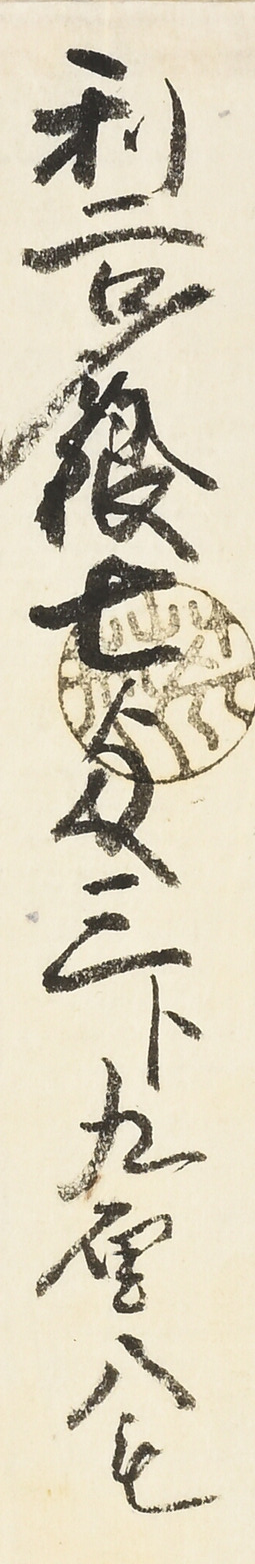利二口〆銀七匁三分九厘八毛
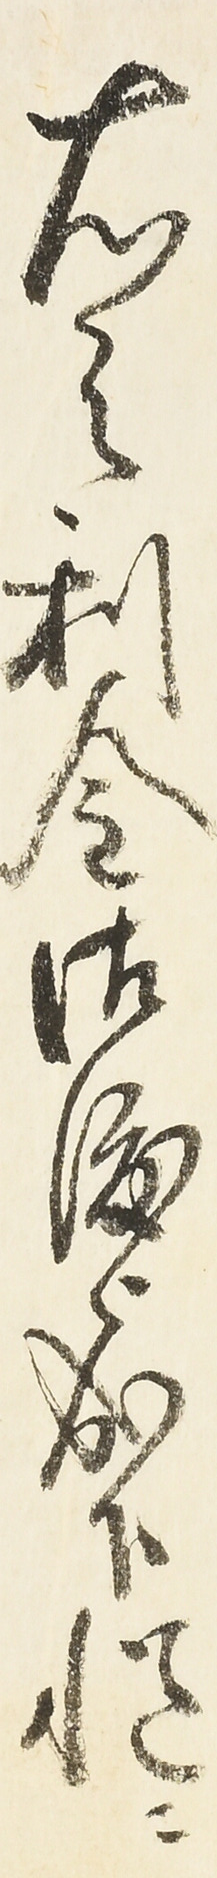右之利金御渡被成下慥ニ
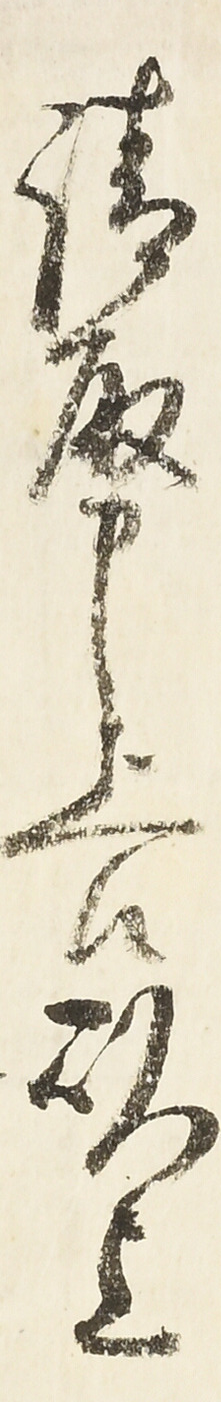請取申上候以上
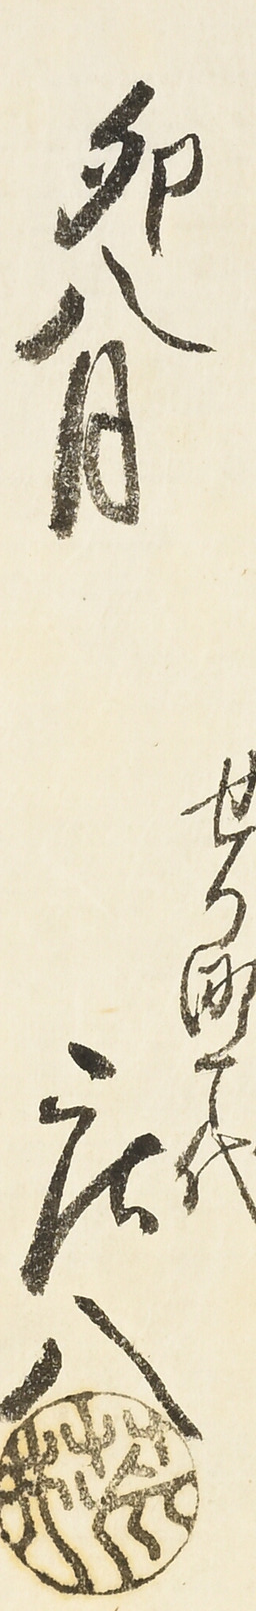卯八月庄八
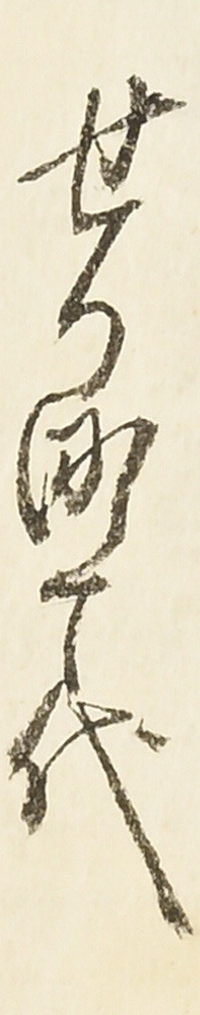せり町丁代
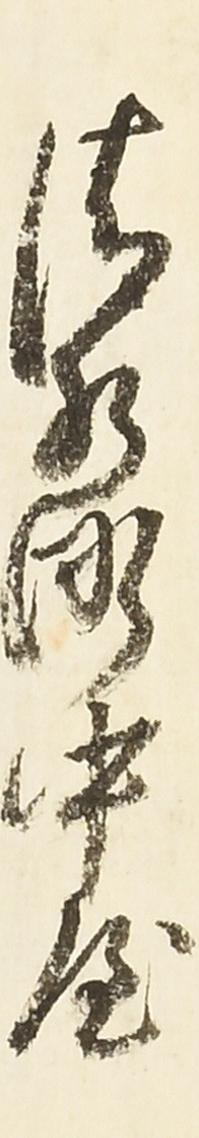清水町丁代
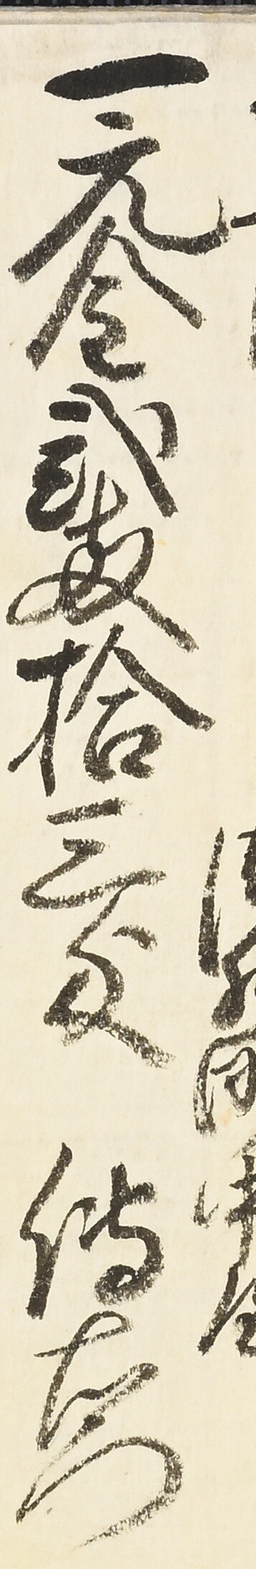一元金弐両拾三匁伝右衛門
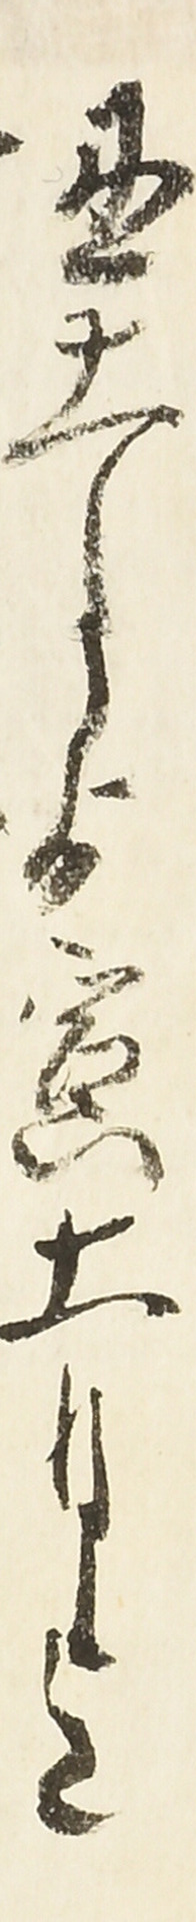丑十一月ゟ寅十一月迄
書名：御才覚金御利足割渡扣帳
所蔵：伊那市立高遠町図書館・合同会社AMANE
